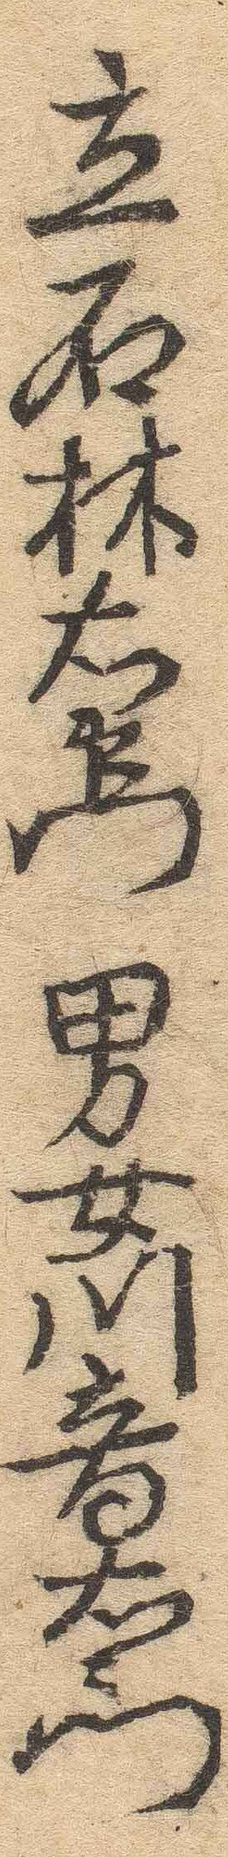立石林右衛門男女川音右衛門
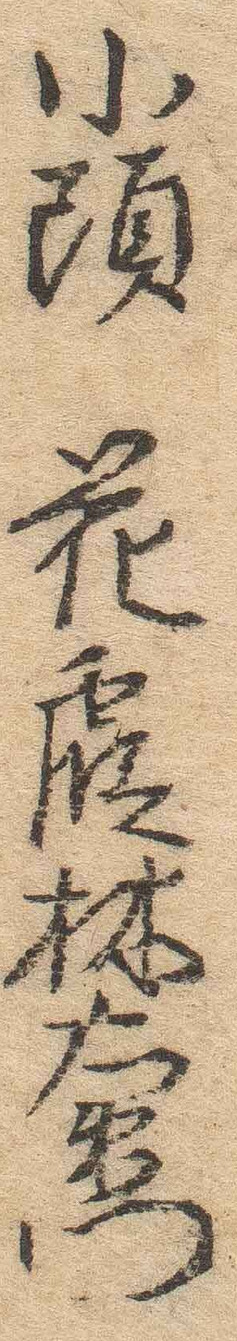小頭花霞林右衛門
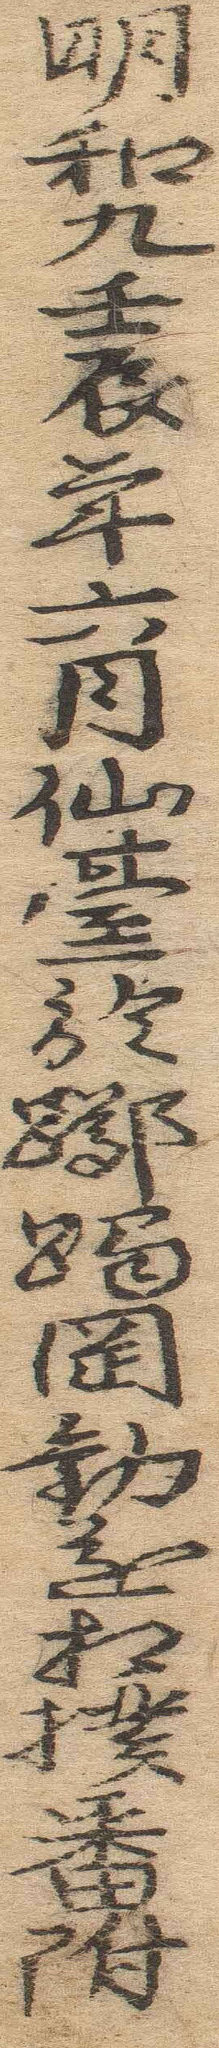明和九壬辰年六月仙台於躑躅岡勧進相撲番附
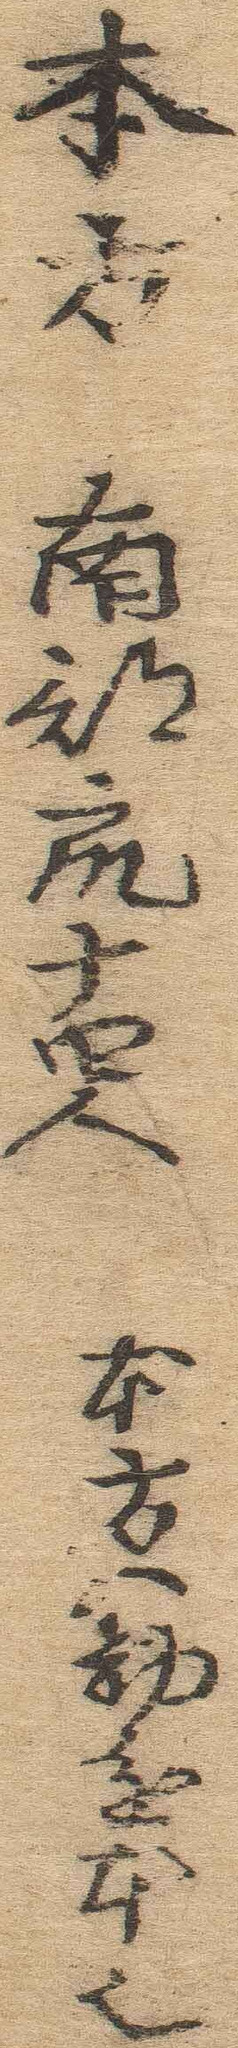本方南部衆十四人本方ハ勧進本也
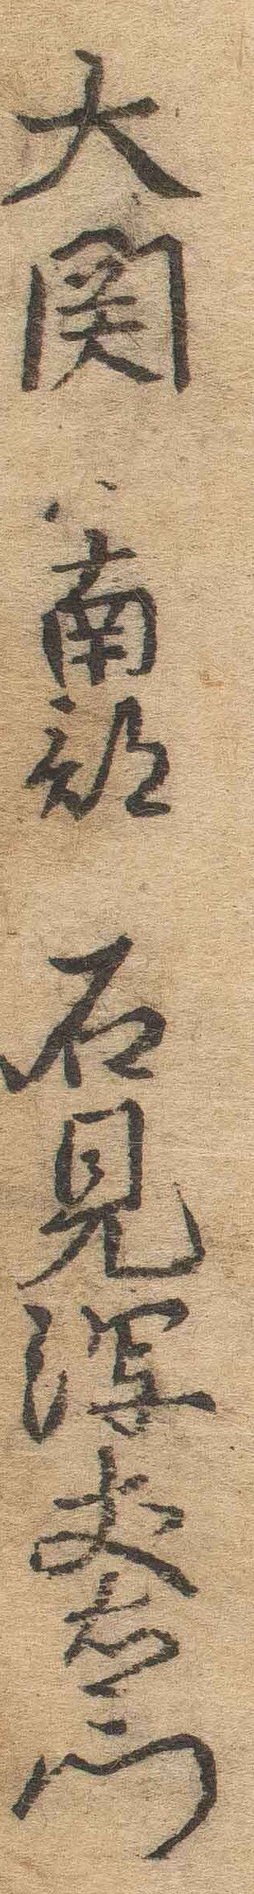大関南部石見潟丈右衛門
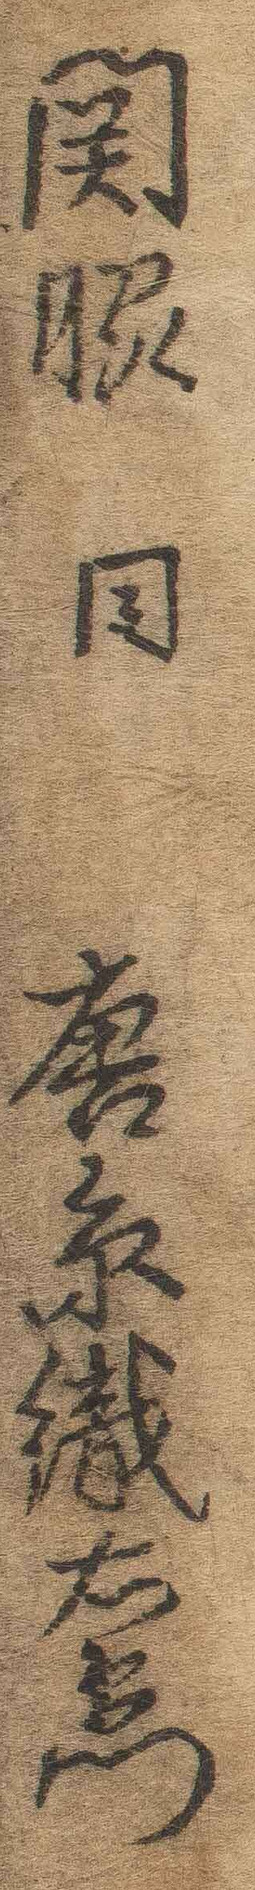関脇同唐糸織右衛門

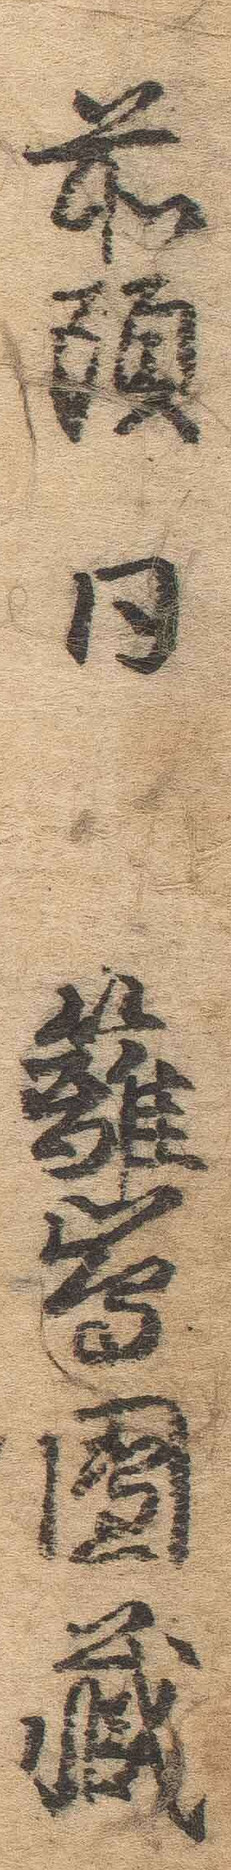前頭同籬嶋団蔵
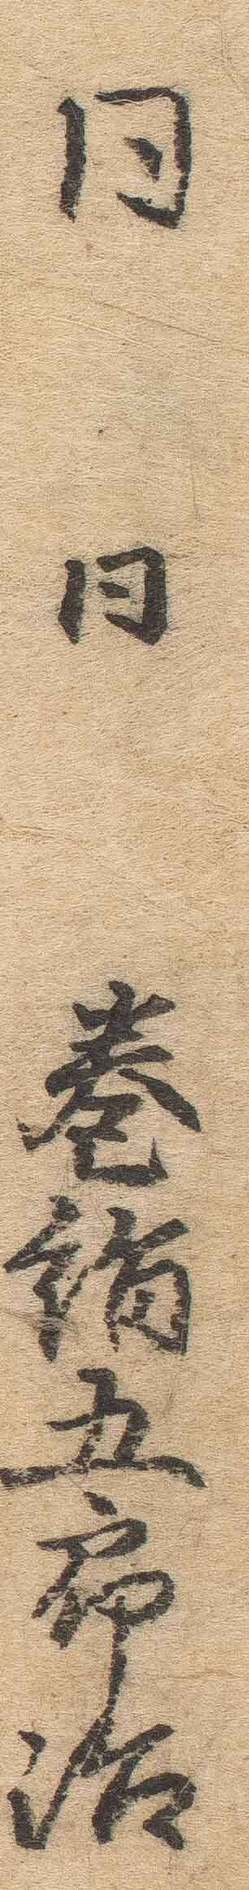同同巻絹五郎治
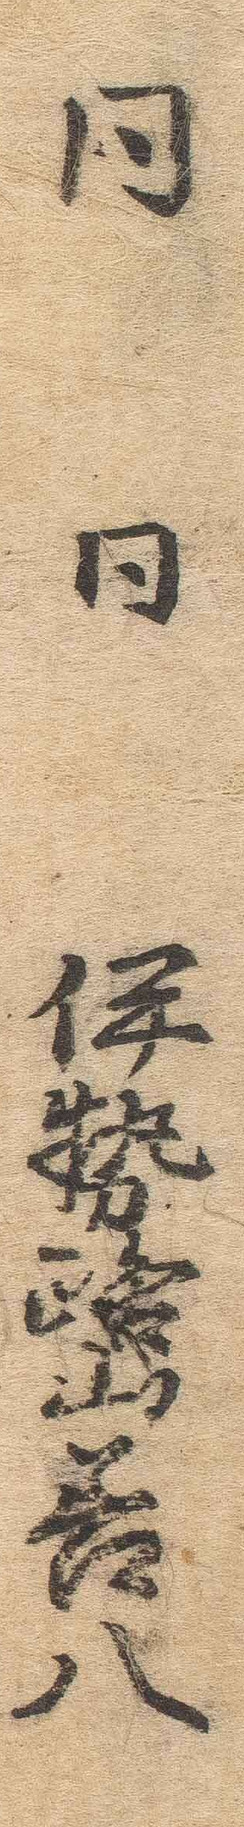同同伊勢路善八
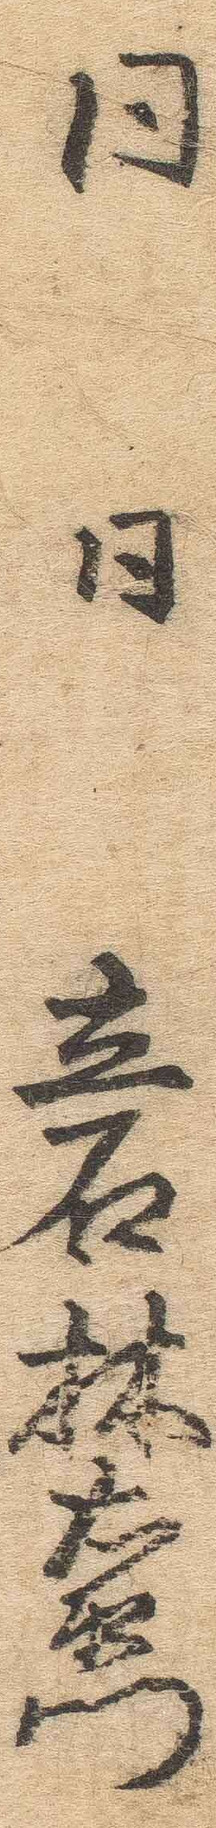同同立石林右衛門
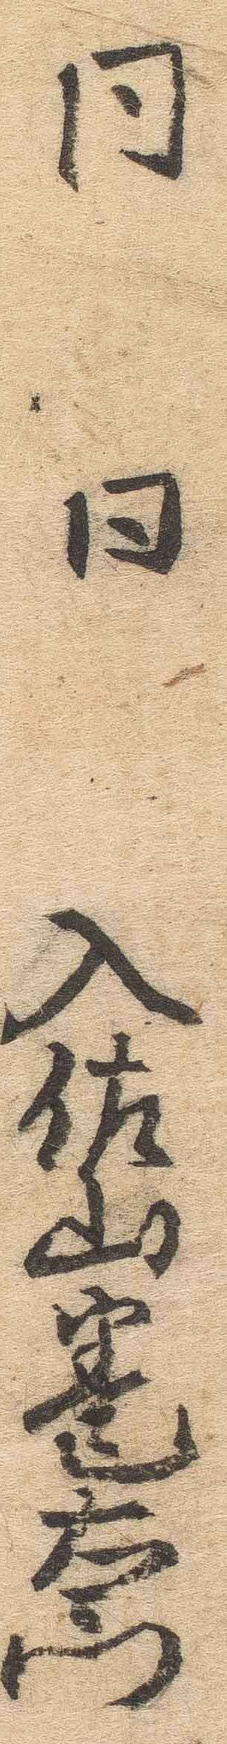同同入佐山巻右衛門
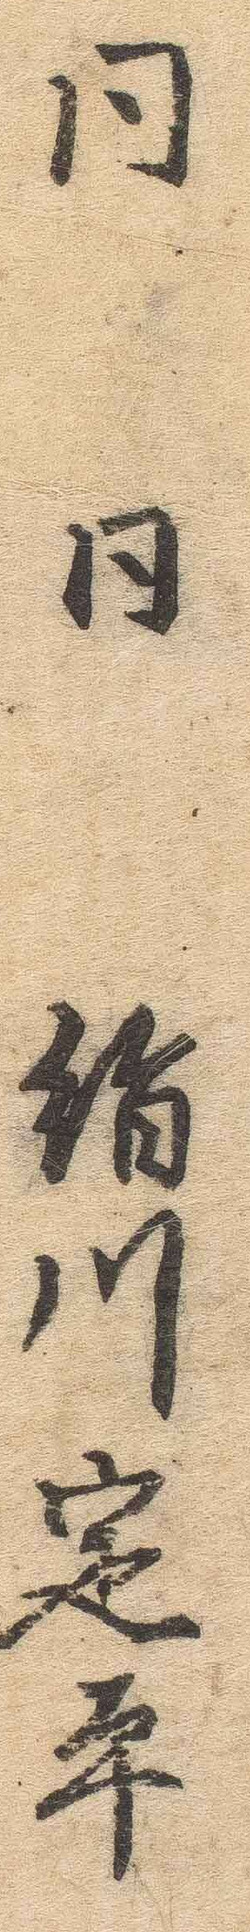同同絹川定平
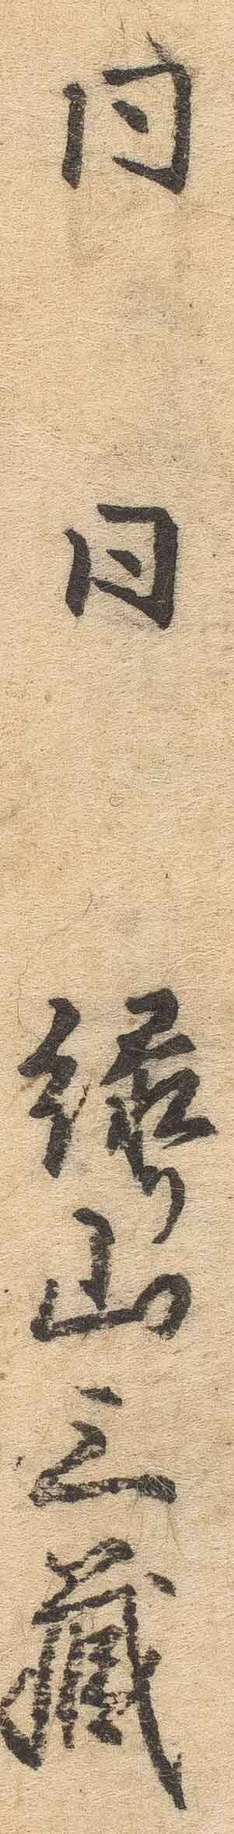同同緑り山三蔵
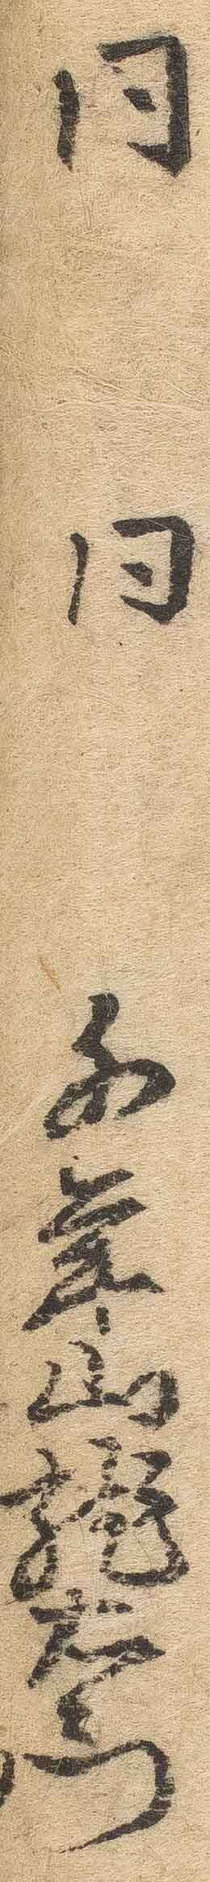同同千年山龍右衛門
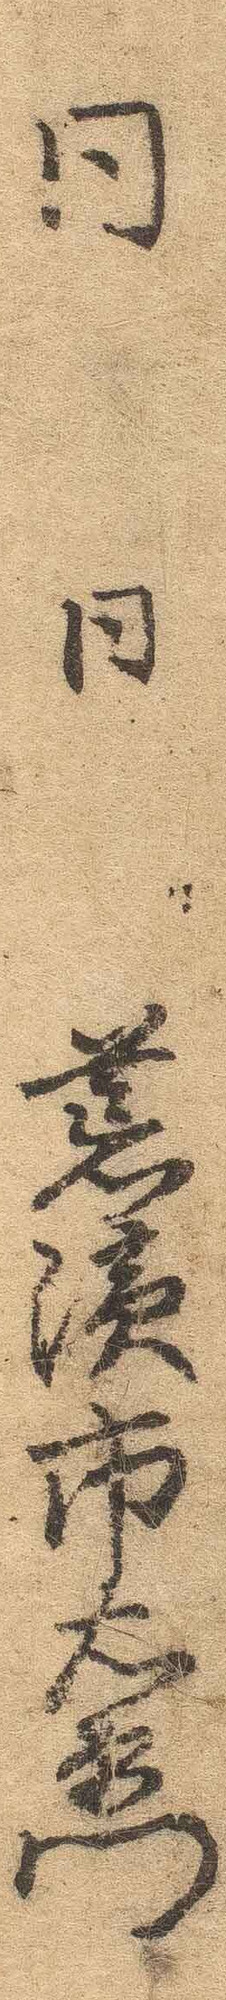同同荒濱市右衛門
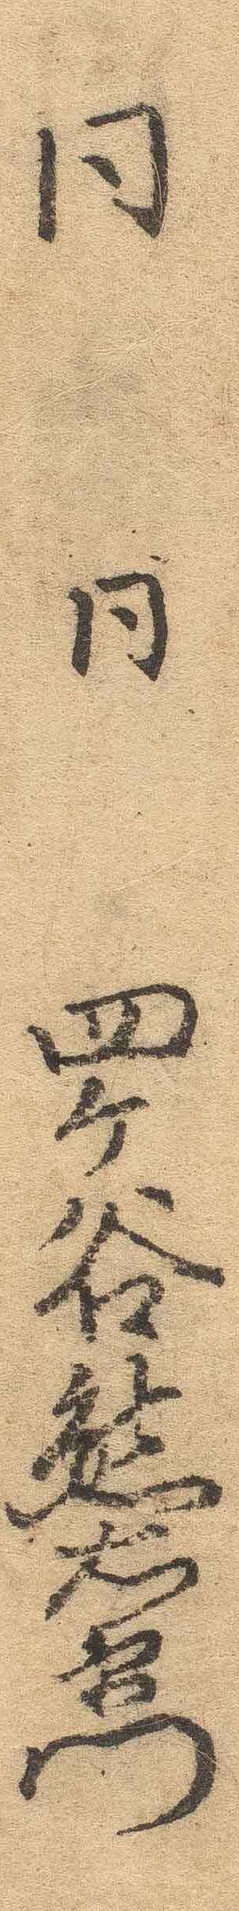同同四ケ谷熊右衛門
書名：古今相撲大全
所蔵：東京学芸大学附属図書館 国文学研究資料館
